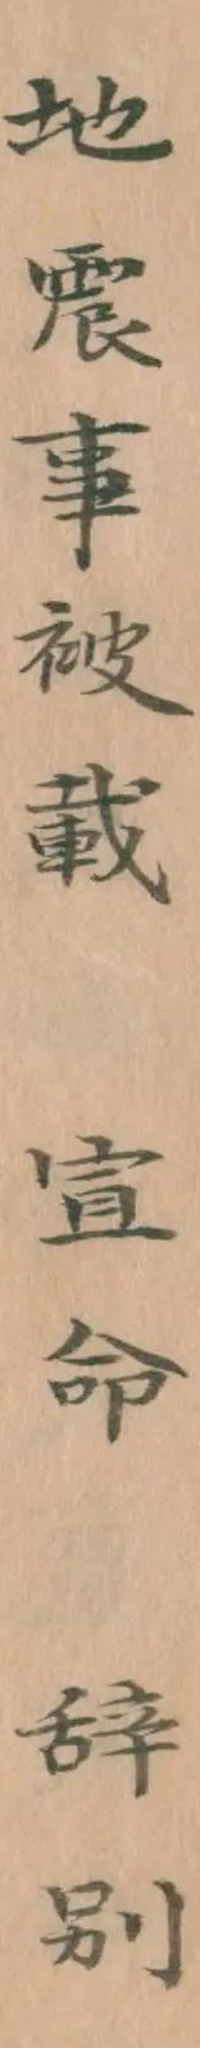地震事被載宣命辞別
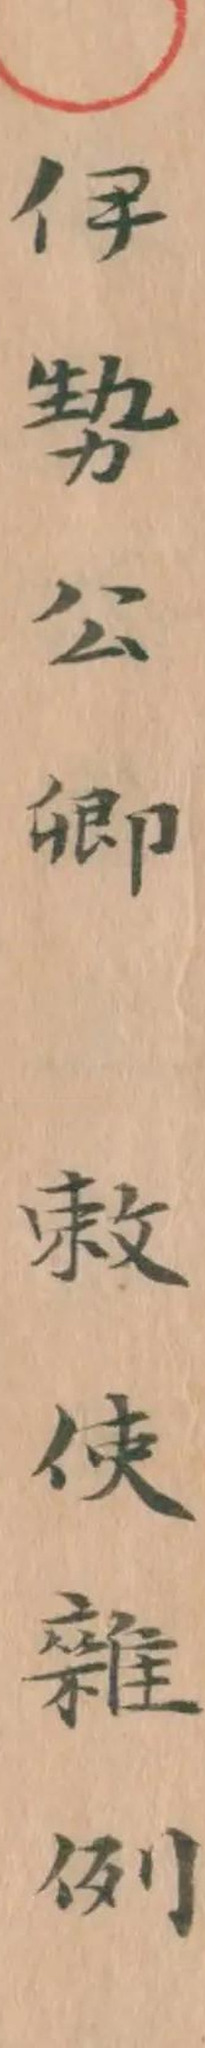○伊勢公卿敇使雑例

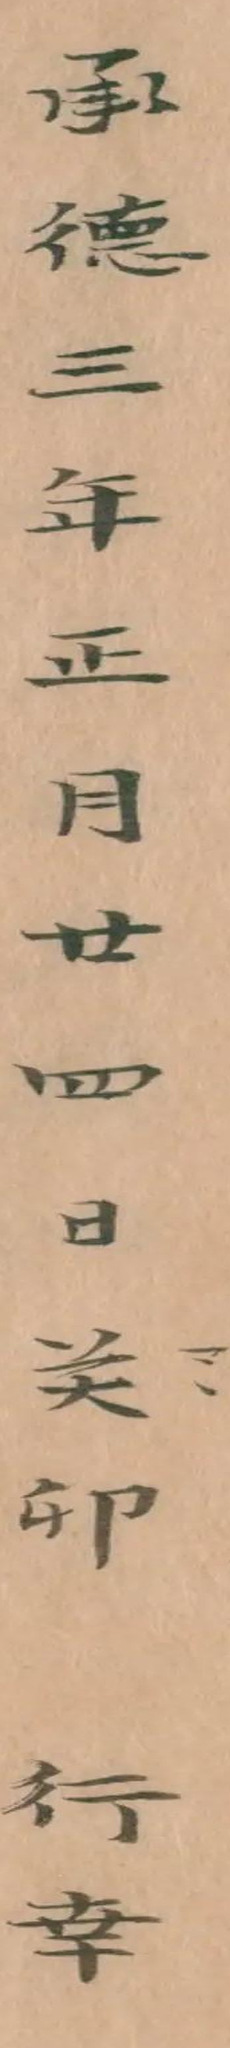承徳三年正月廿四日关卯行幸
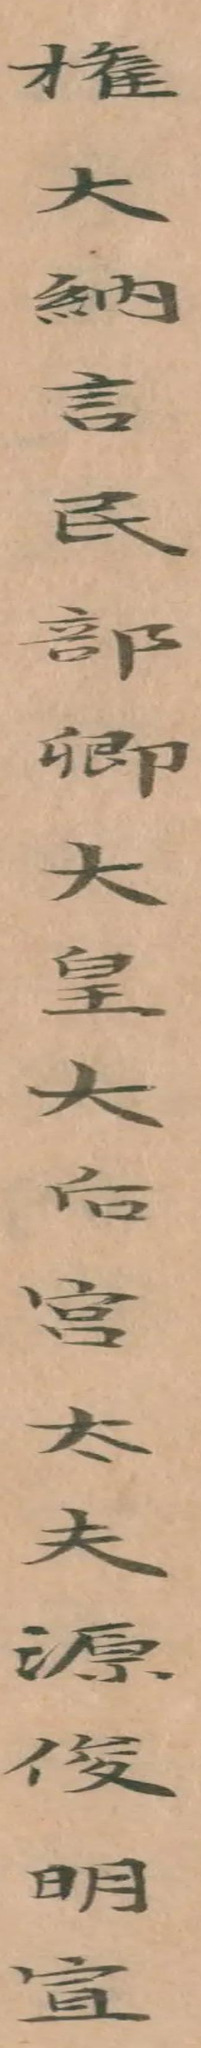権大納言民部卿大皇大后宮太夫源俊明宣
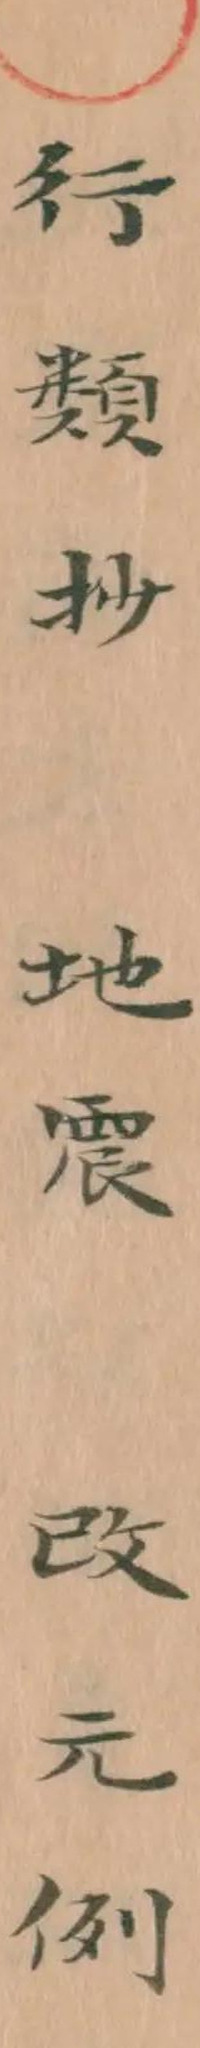○行類抄地震改元例
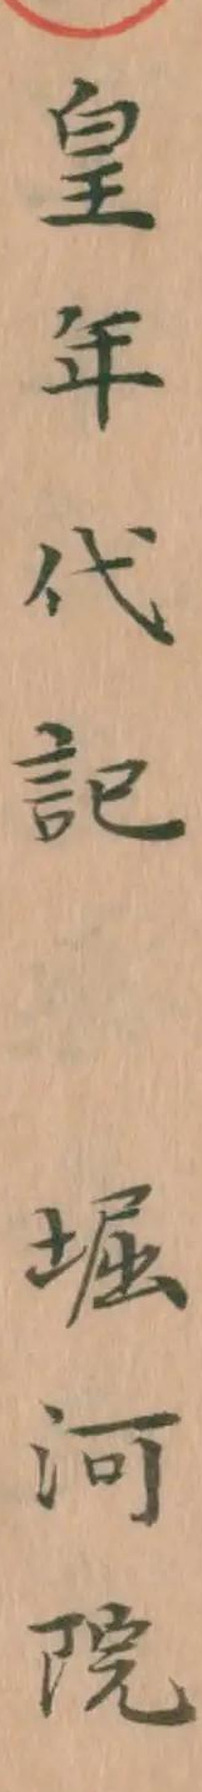○皇年代記堀河院
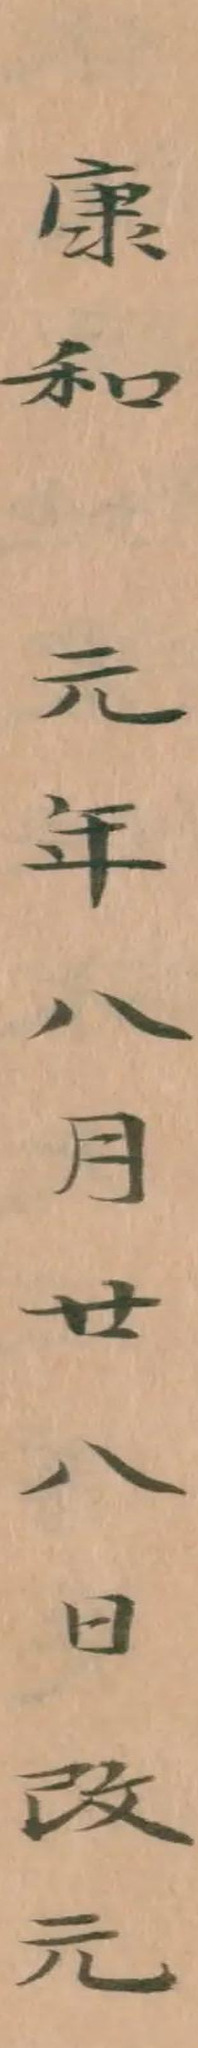康和元年八月廿八日改元
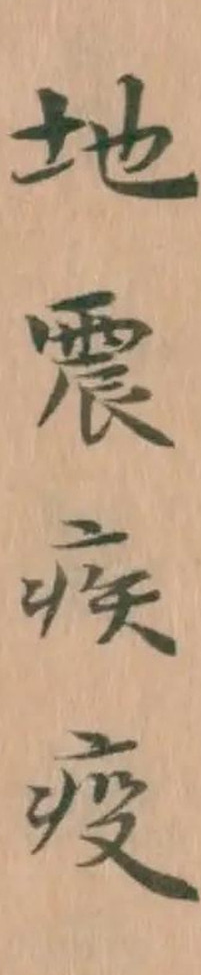地震疾疫
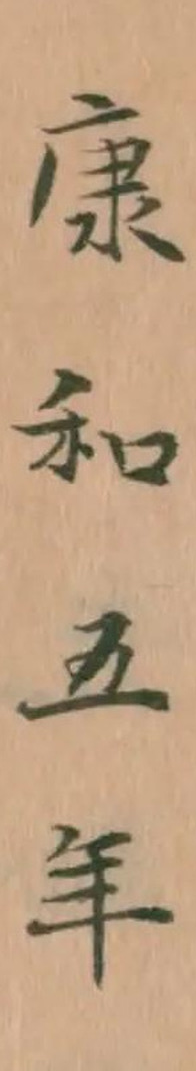康和五年
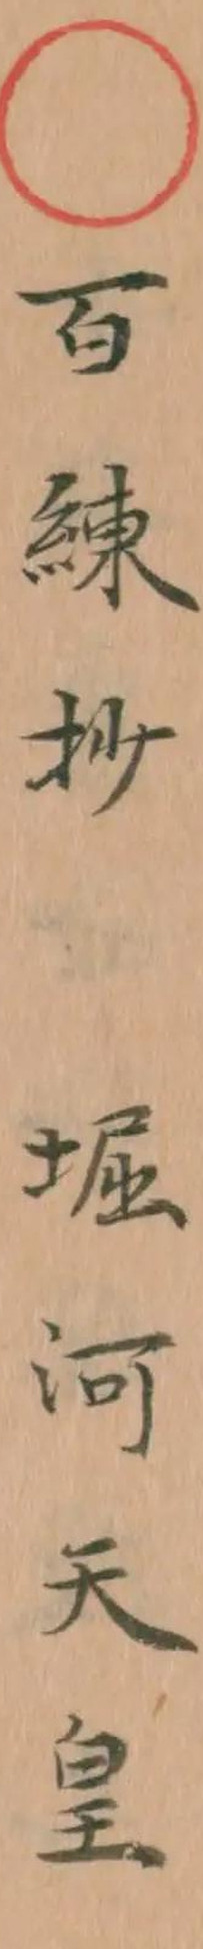○百練抄堀河天皇
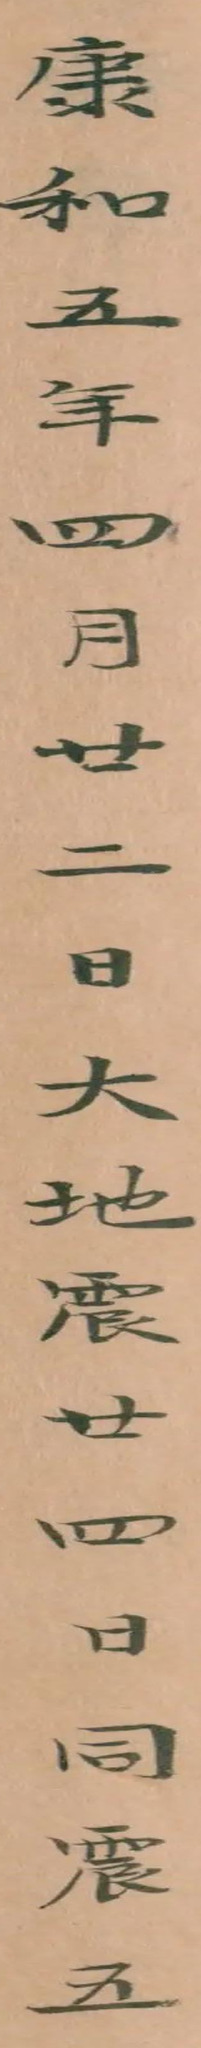康和五年四月廿二日大地震廿四日同震五
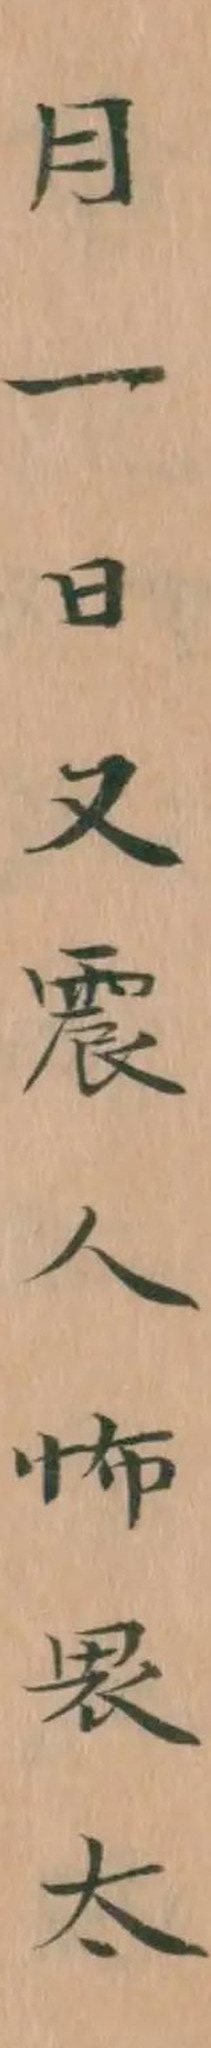月一日又震人怖畏太
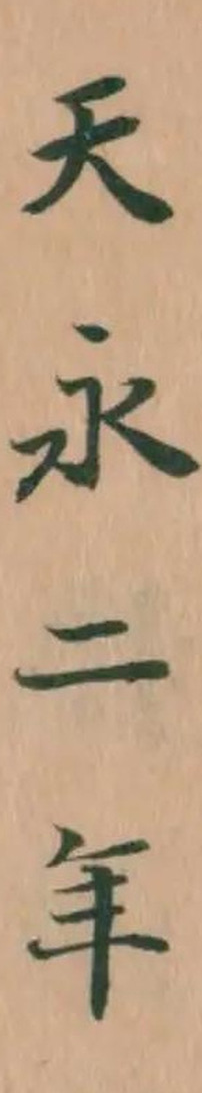天永二年
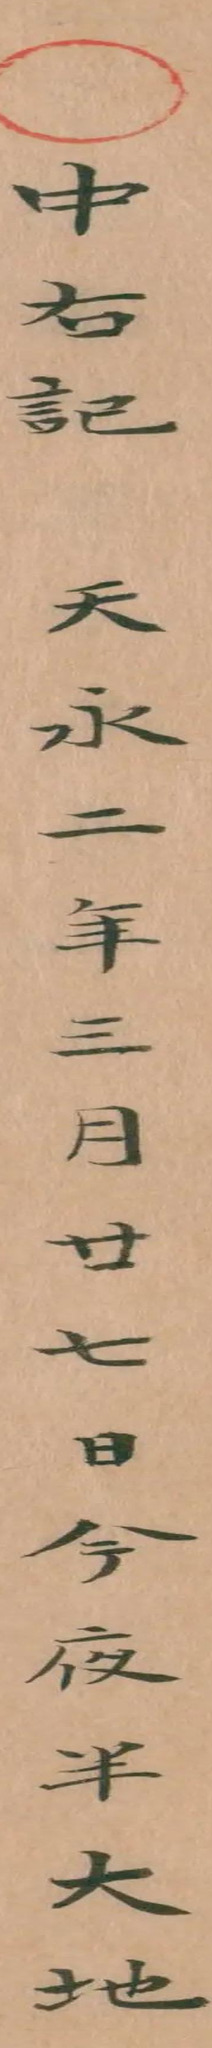○中右記天永二年三月廿七日今夜半大地
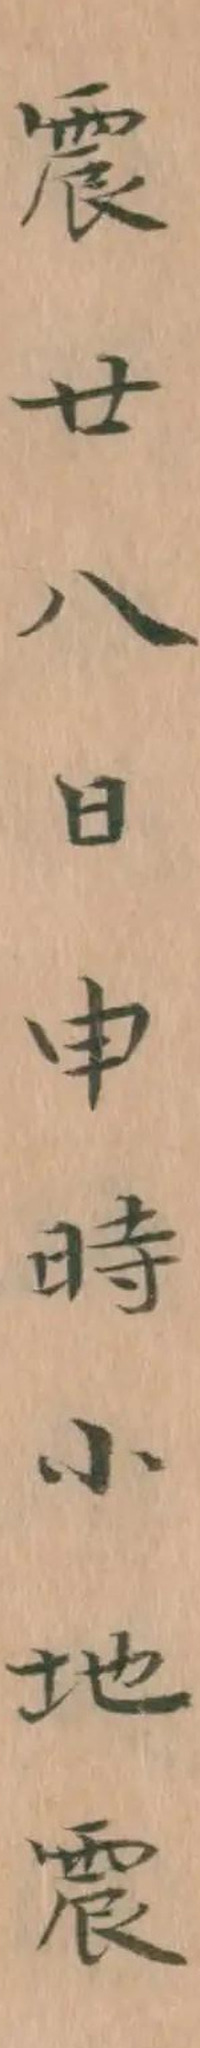震廿八日申時小地震
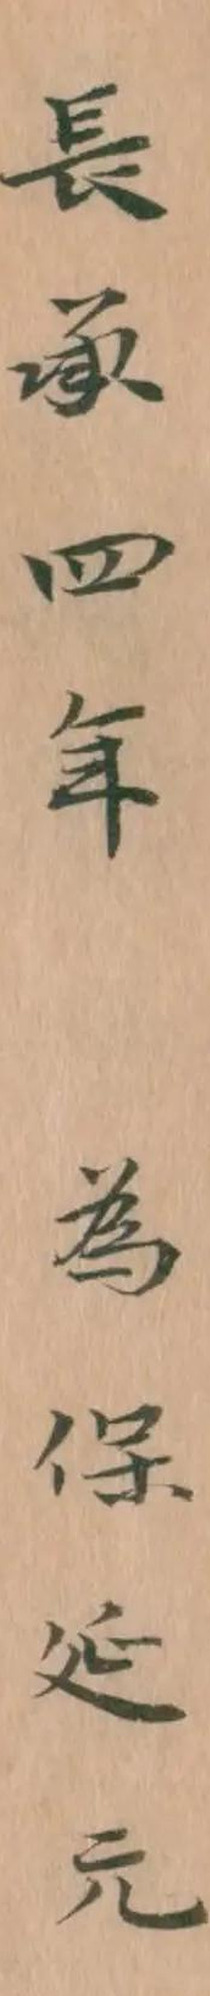長承四年為保延元
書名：地災撮要. 巻5-6(地震之部)
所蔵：国立国会図書館 National Diet Library, JAPAN
